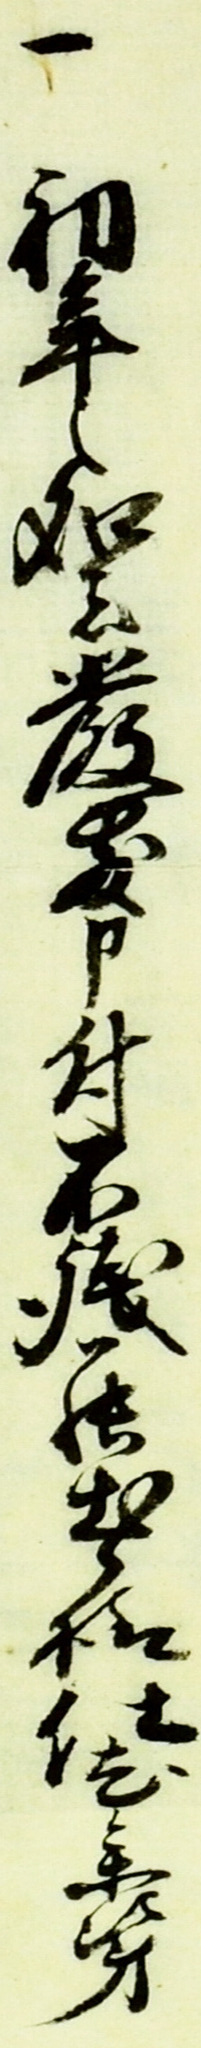初年之処者厳敷申付不残罷出候様仕尤参次第
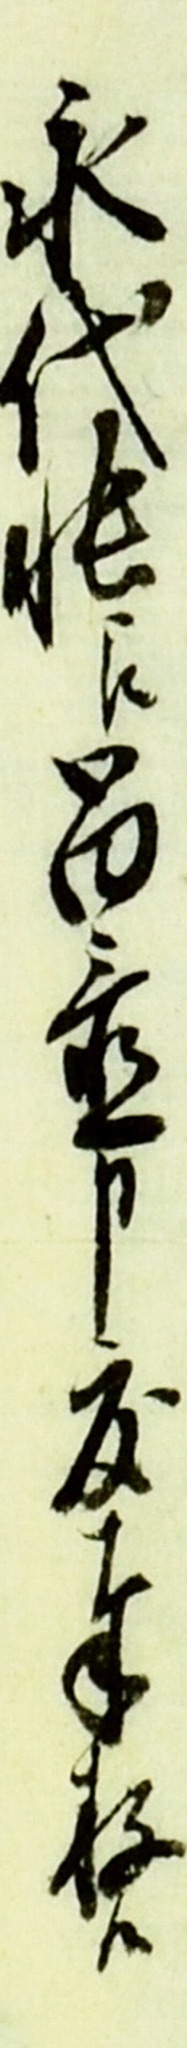永代帳江品置申度奉存刻
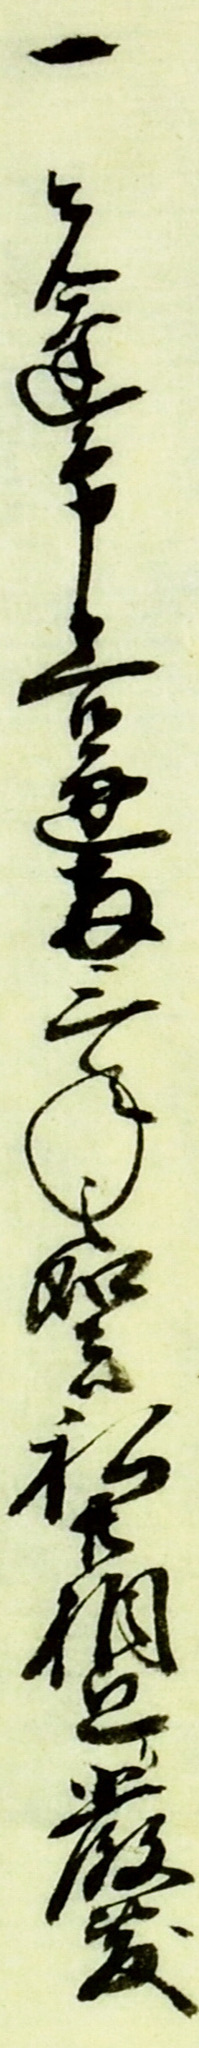一先達不申上候通両三年之処者私共相廻り厳敷
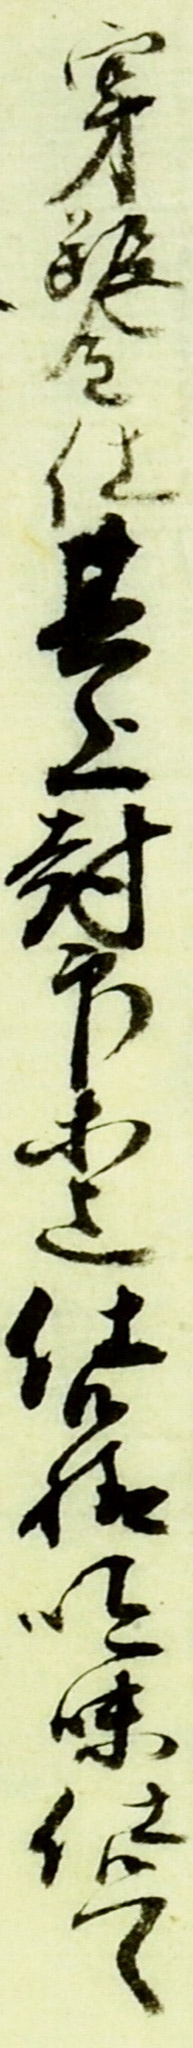穿鑿仕其上封印等迄仕候様吟味仕候ハヽ
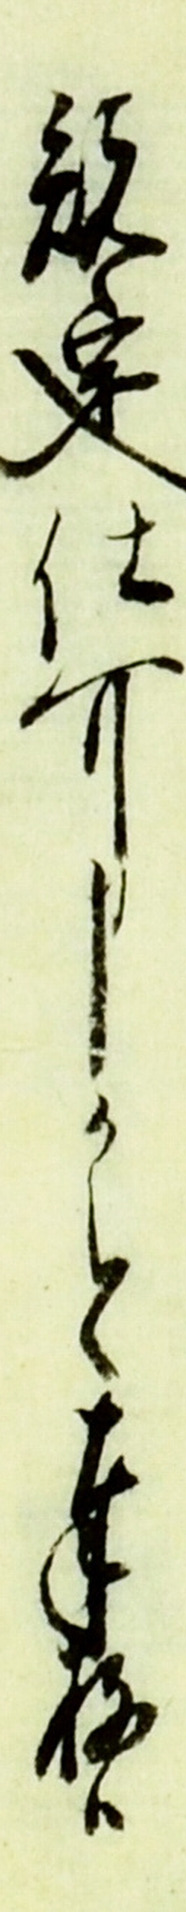規定仕可申かと奉存候
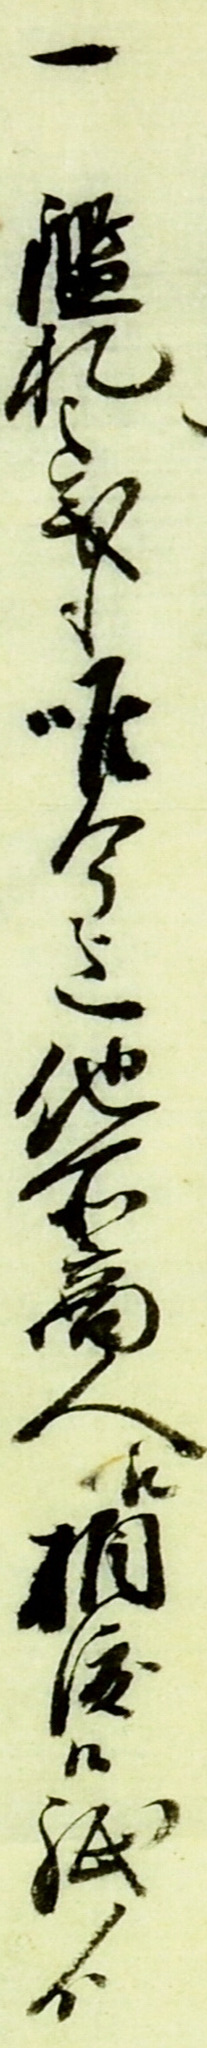一鑑札之義も唯今迄他所商人江相渡候紙ゟ
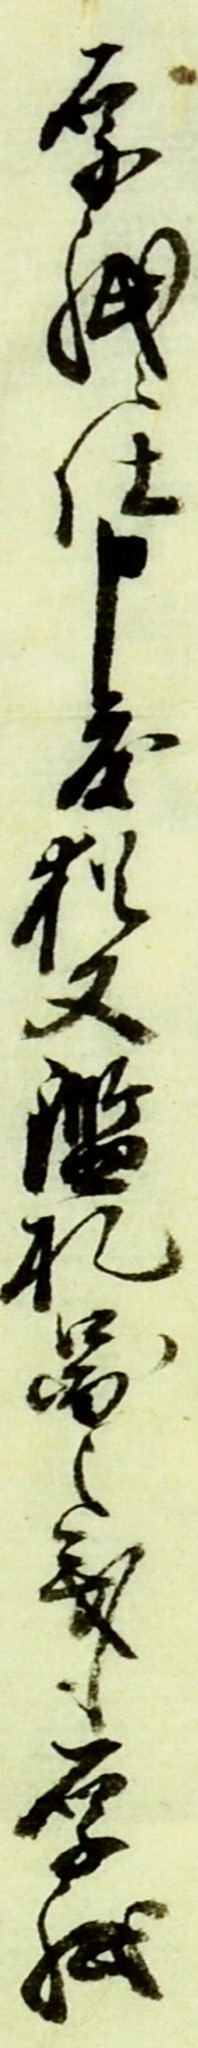厚紙ニ仕申度猶又鑑札図之義も厚紙
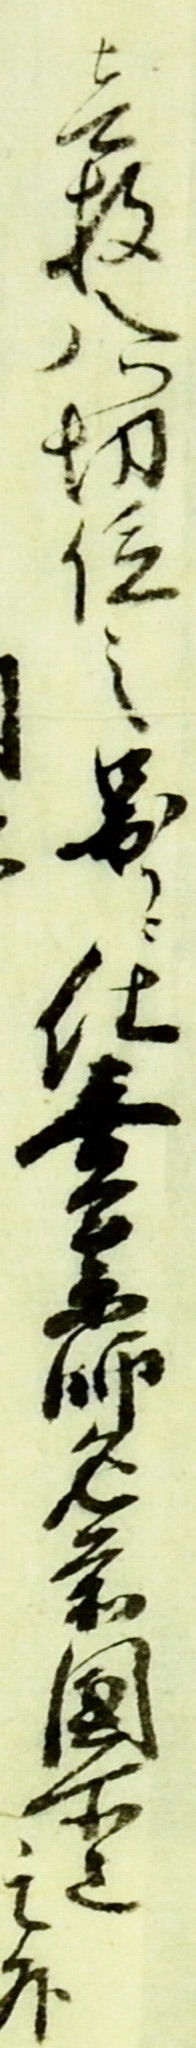被可扱八つ切位之図りニ仕売薬師名前国所迄之外
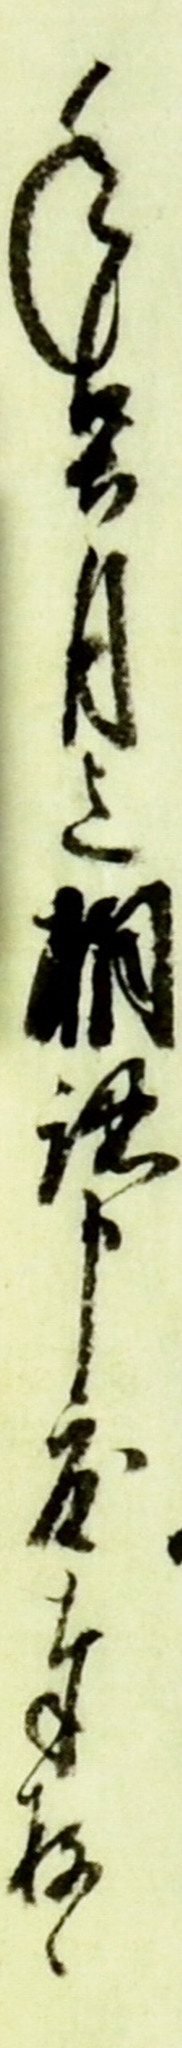年号月迄相認申度奉存候

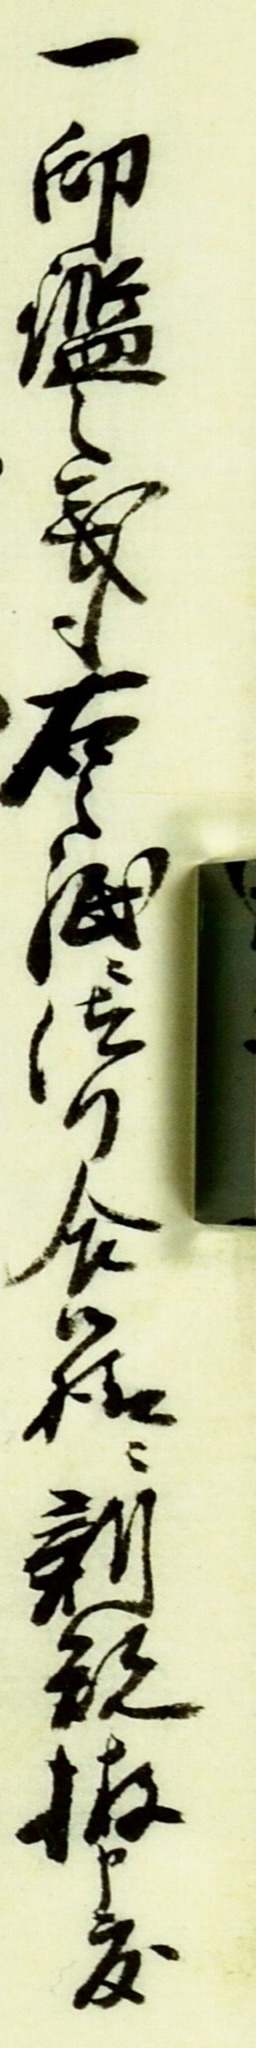一印鑑之義も右之紙ニつり合候様ニ新規拵申度
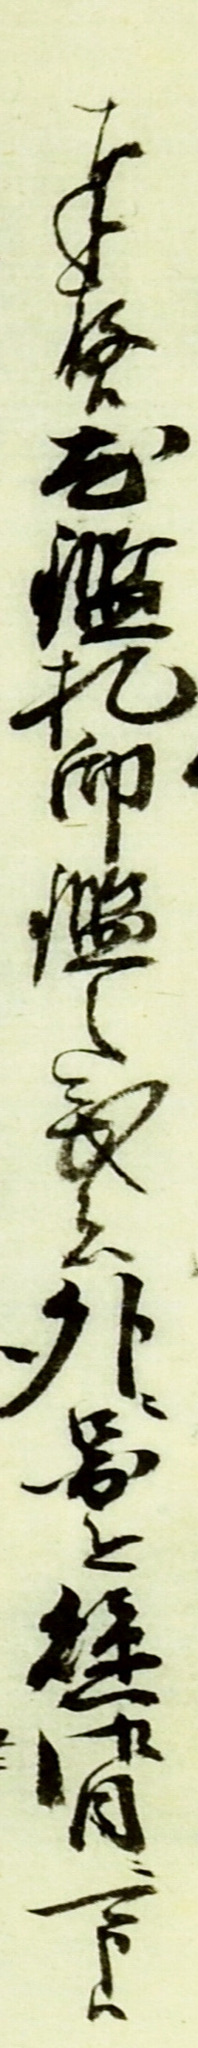奉存候尤鑑札印鑑之義者外ニ図を継御目ニ可申候
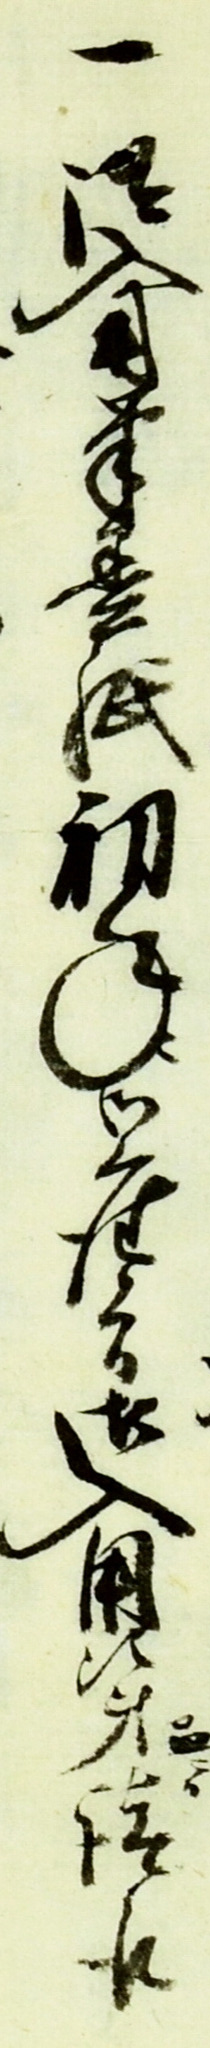御入用筆墨紙初年ニ御座候間御入用次第請取
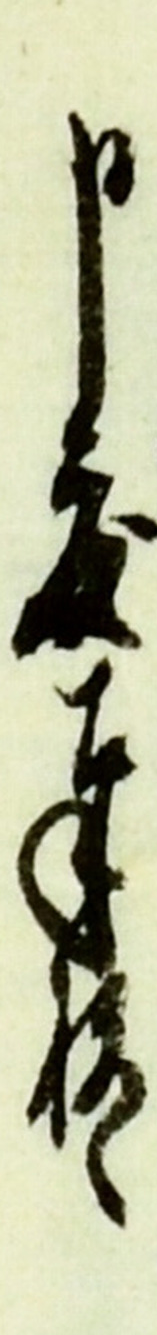申度奉存候
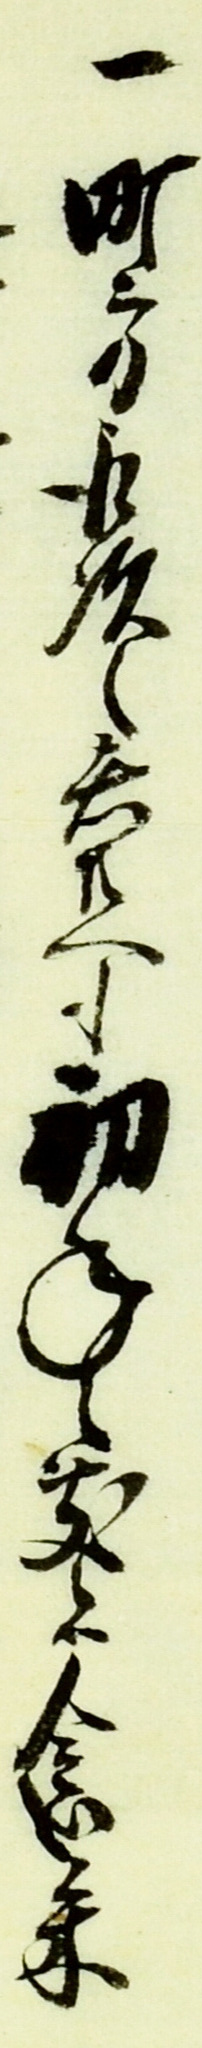一町方取次之者共へも初年之処者金弐朱
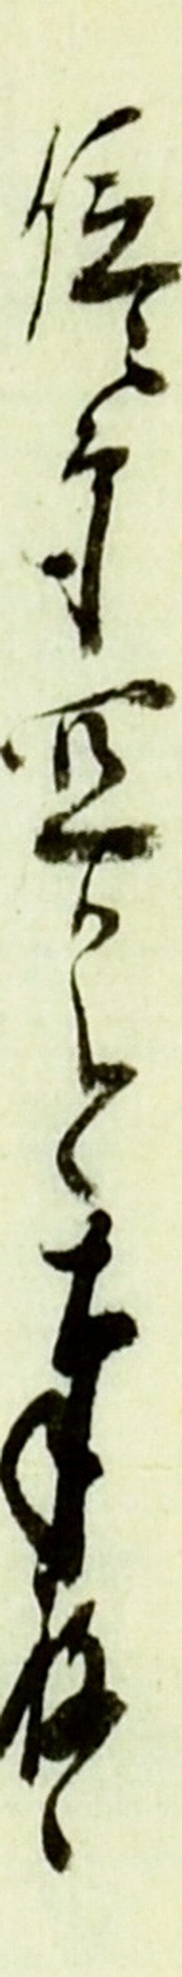位ニ而も宜かと奉存候
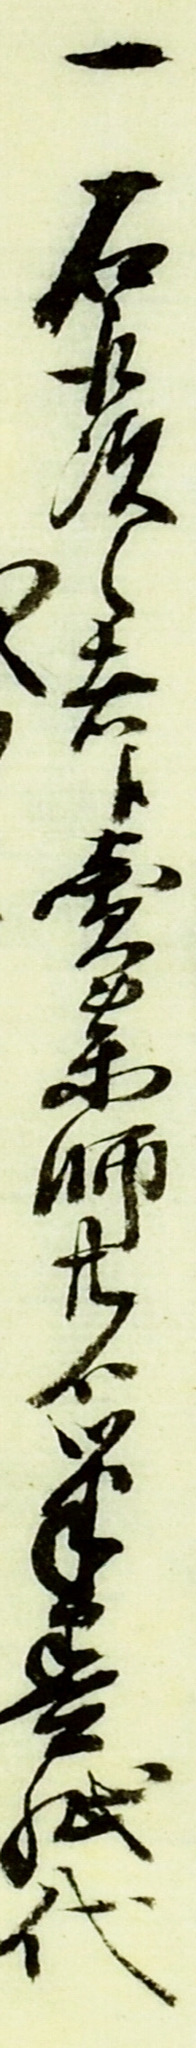一右取次之者江売薬師共ゟ筆墨紙代
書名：他国賣薬師運上之事
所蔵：伊那市立高遠町図書館・合同会社AMANE
